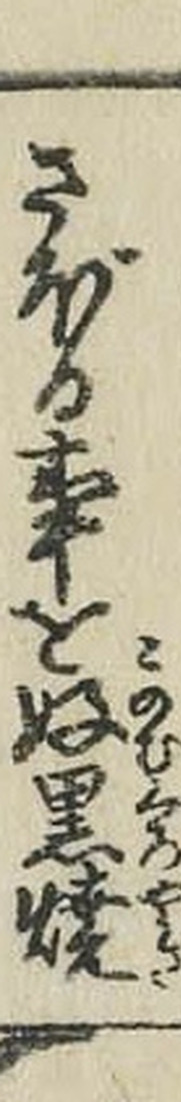さぼる事を好黒焼
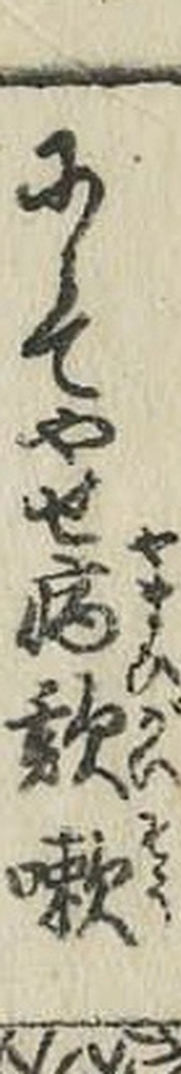にしてやせ病欬嗽
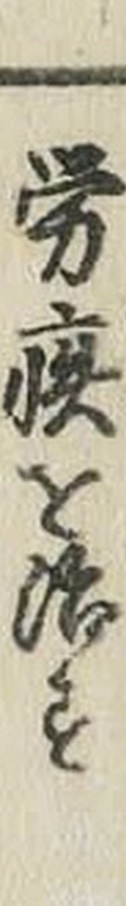労疾を治す
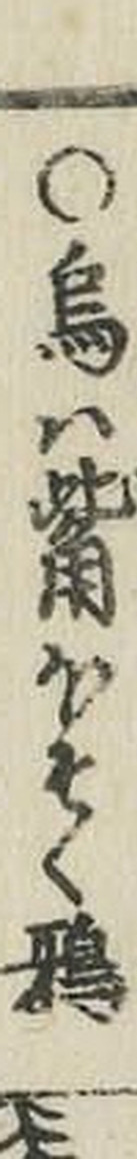○烏は觜ほそく鴉
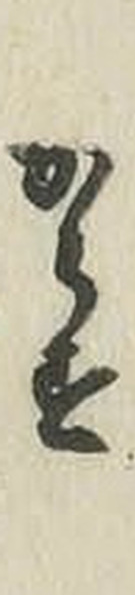からす
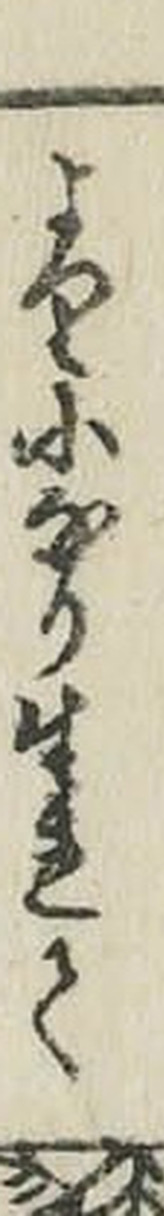より小なり生れて
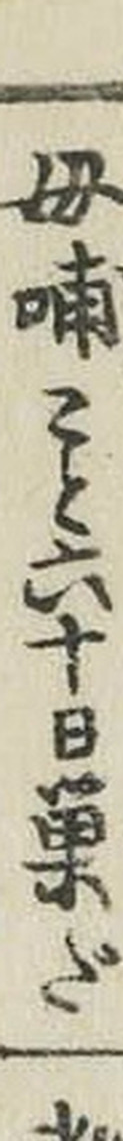母哺こと六十日巣だ
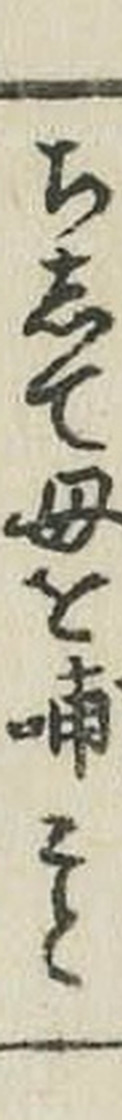ちして母を哺こと
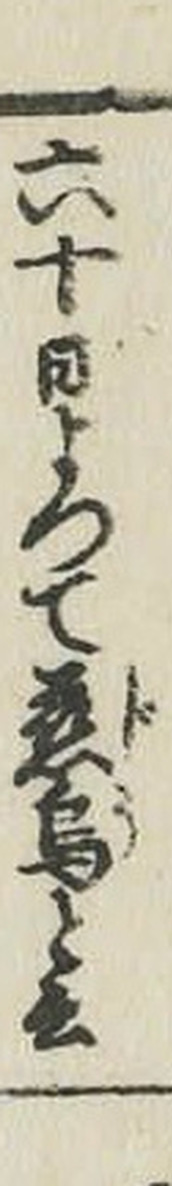六十日よつて慈烏と云
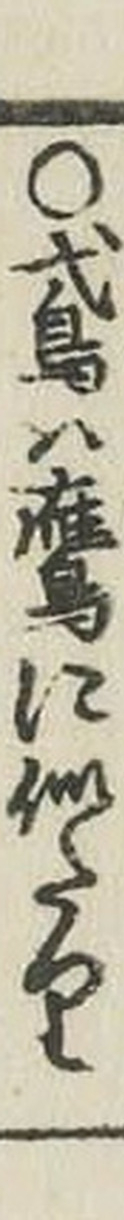○鳶は鷹に似たり
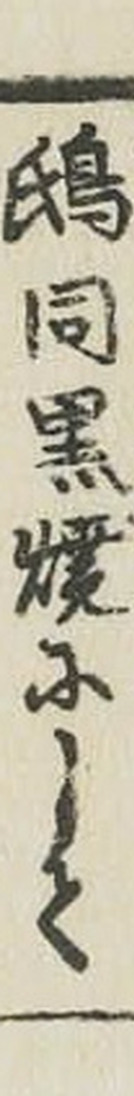鴟同黒焼にして
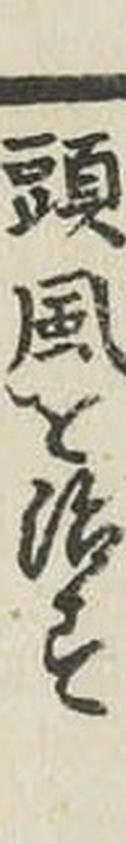頭風を治す
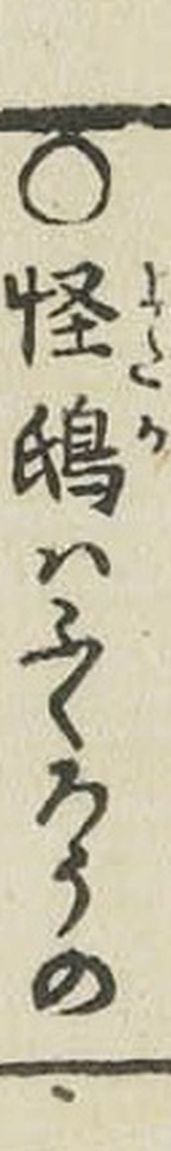○怪鴟はふくろうの
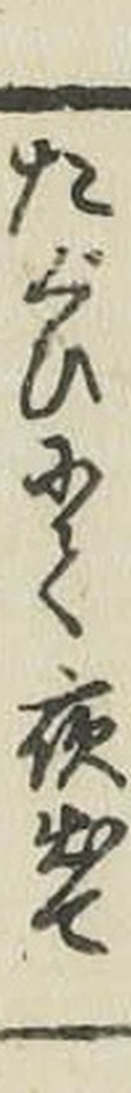たぐひにて夜出て
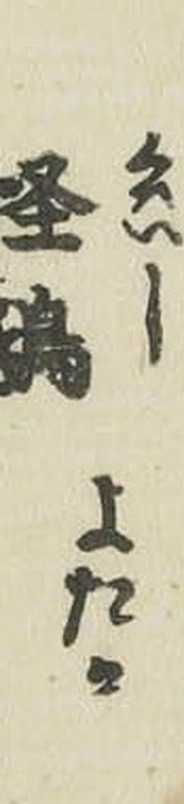怪鴟よたか
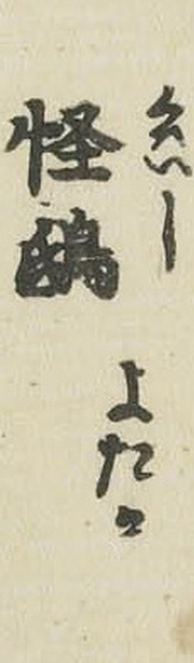怪鴟よたか
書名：増補頭書訓蒙図彙大成 10巻 6:巻之12-13
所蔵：東京学芸大学教育コンテンツアーカイブ
